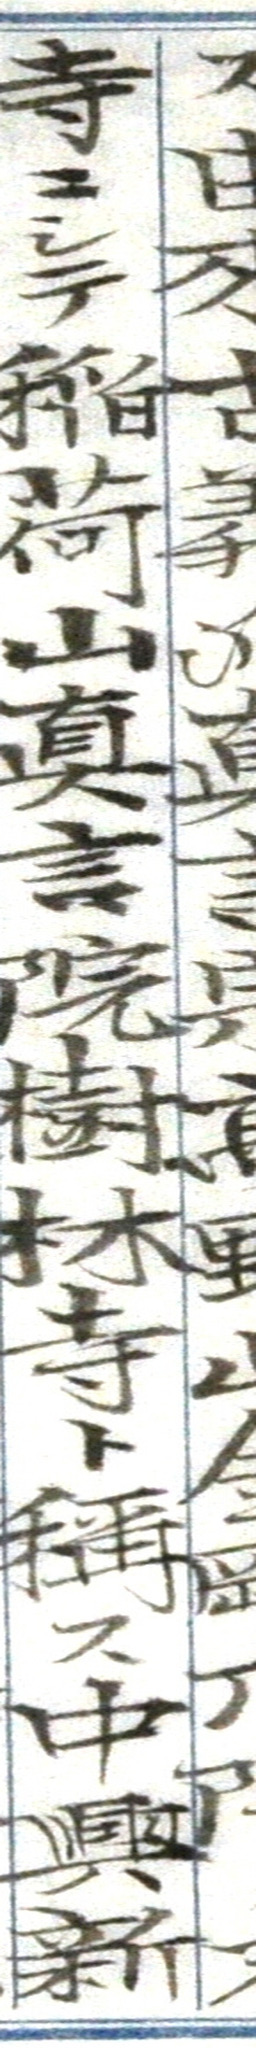寺ニシテ稲荷山真言院樹林寺ト称ス中興新
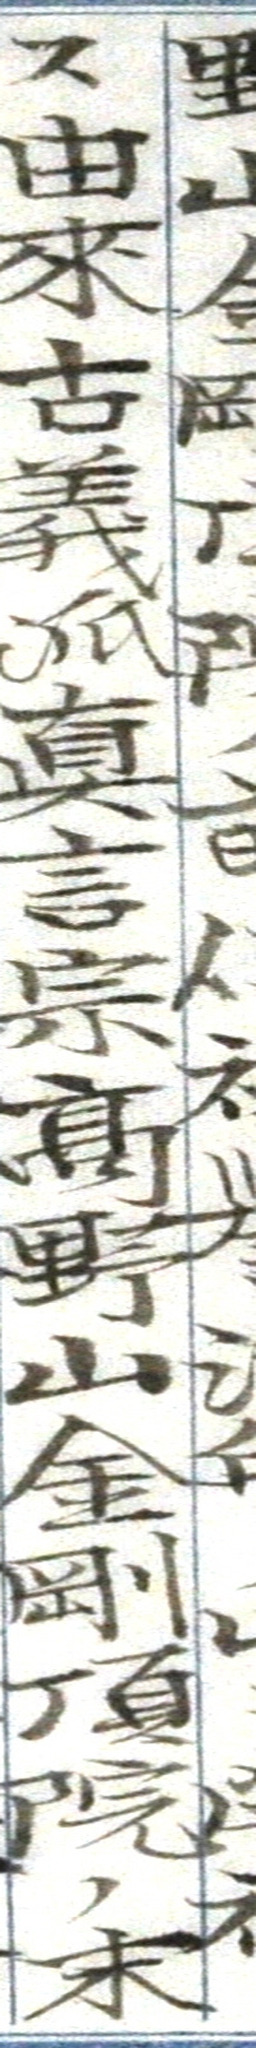ス由来古義派真言宗高野山金剛頂院ノ末
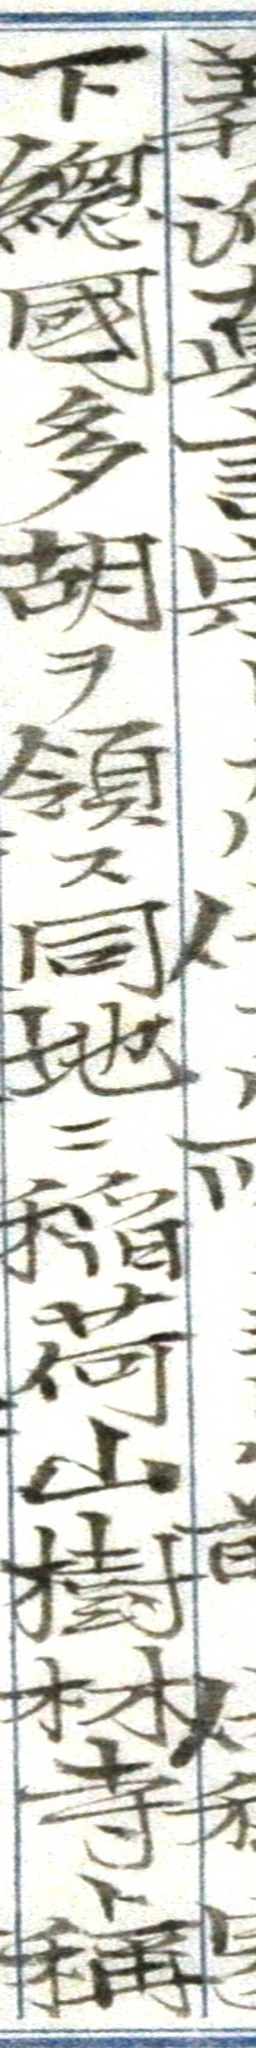下総国多胡ヲ領ス同地ニ稲荷山樹林寺ト称
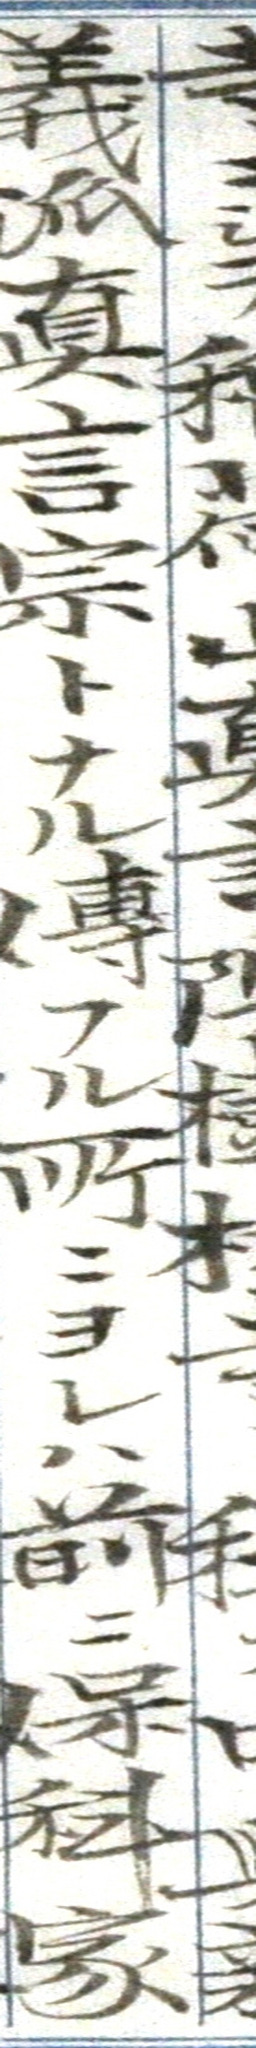義派真言宗トナル伝フル所ニヨレハ前ニ保科家
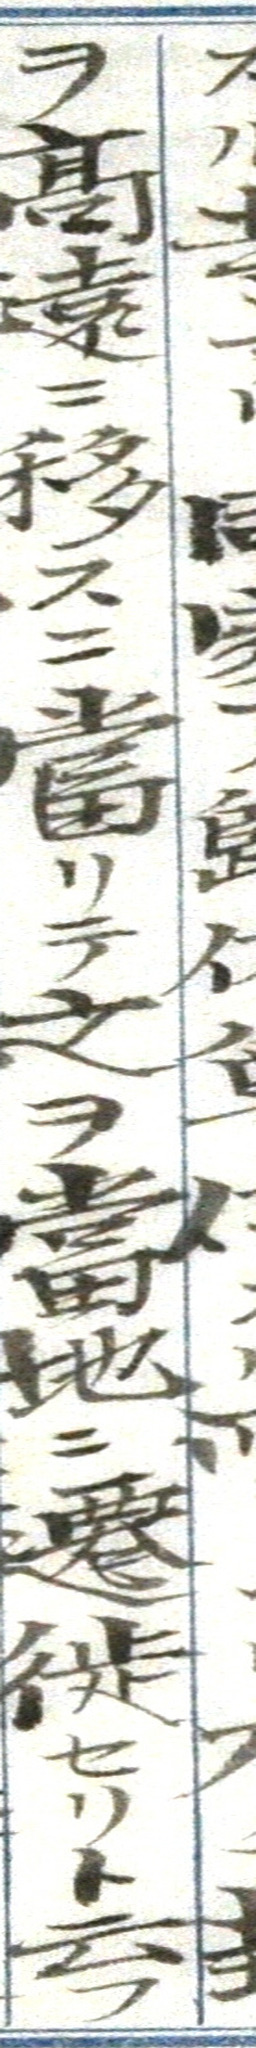ヲ高遠ニ移スニ当リテ之ヲ当地ニ遷徙セリト云フ
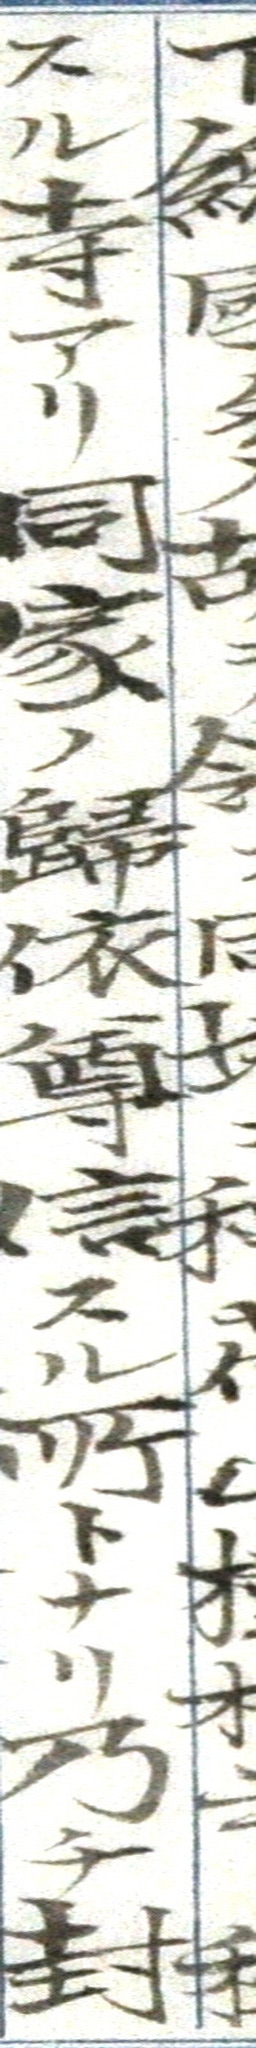スル寺アリ同家ノ帰依尊信スル所トナリ乃チ封
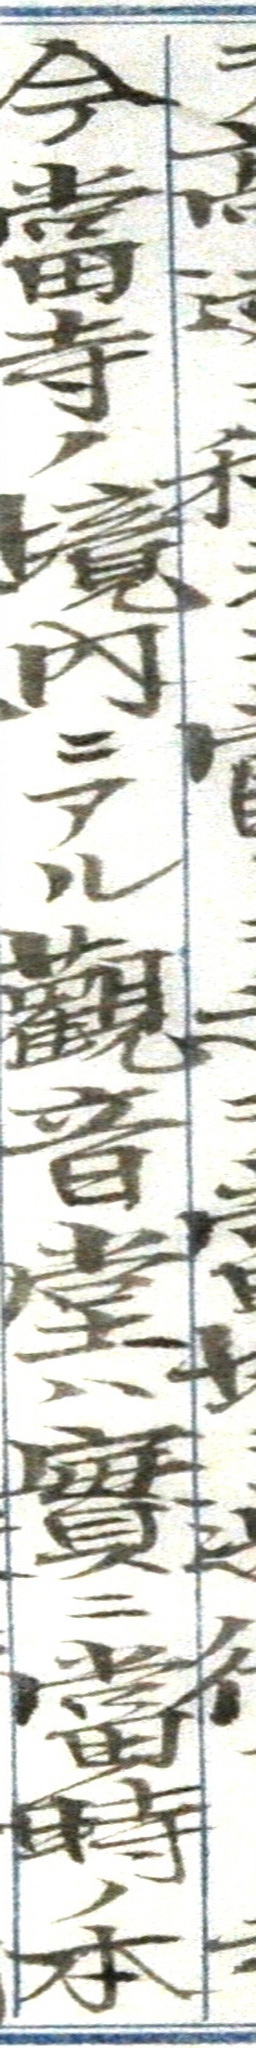今当寺ノ境内ニアル観音堂ハ実ニ当時ノ本
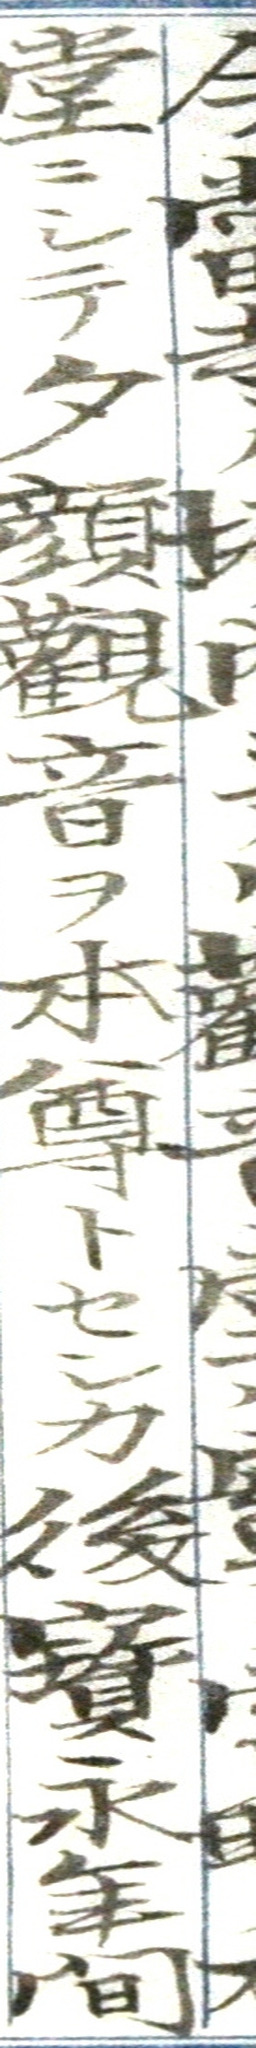堂ニシテ夕顔観音ヲ本尊トセシカ後宝永年間

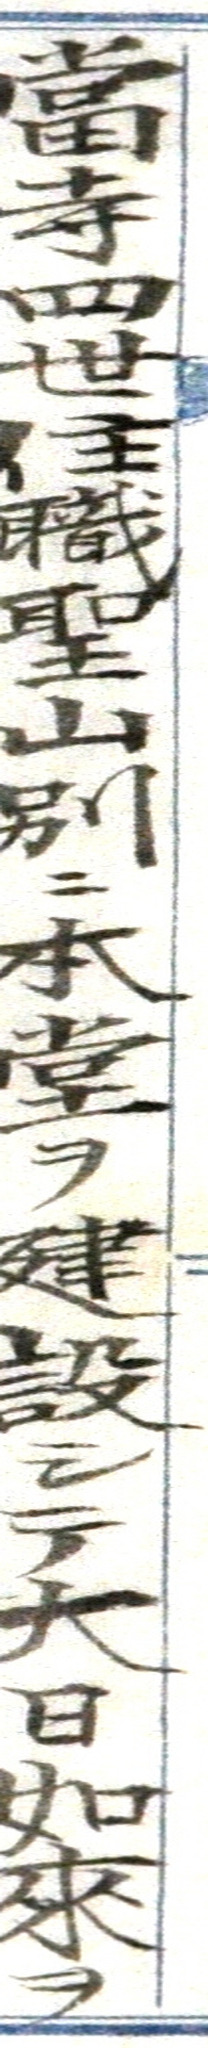当寺四世住職聖山別ニ本堂ヲ建設シテ大日如来ヲ
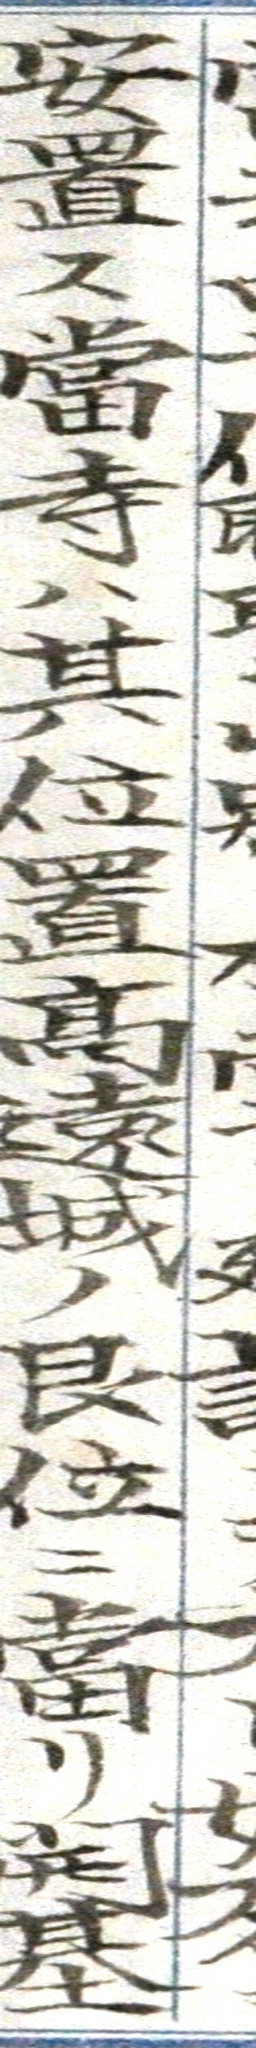安置ス当寺ハ其位置高遠城オ艮位ニ当リ開基
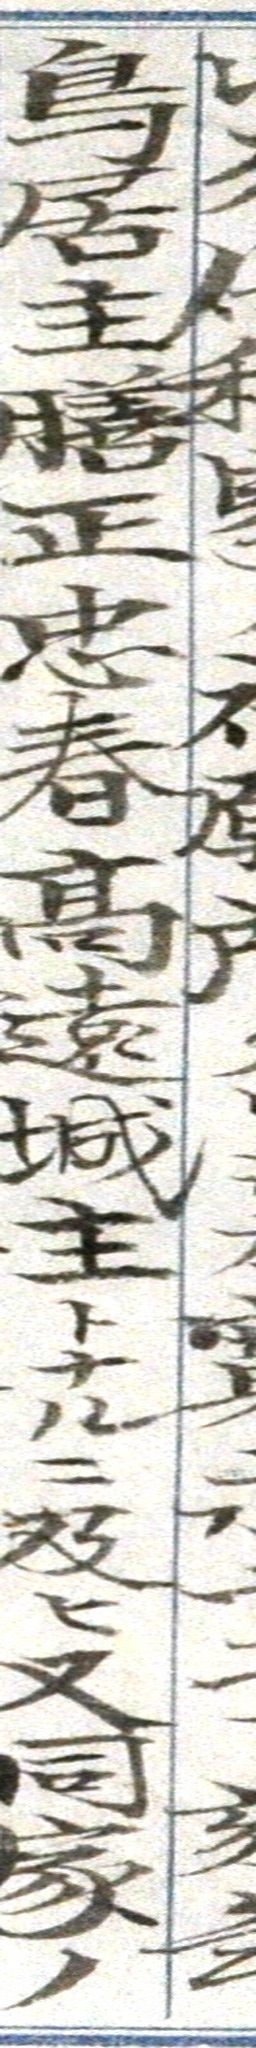鳥居主膳正忠春高遠城主トナルニ及ヒ又同家ノ
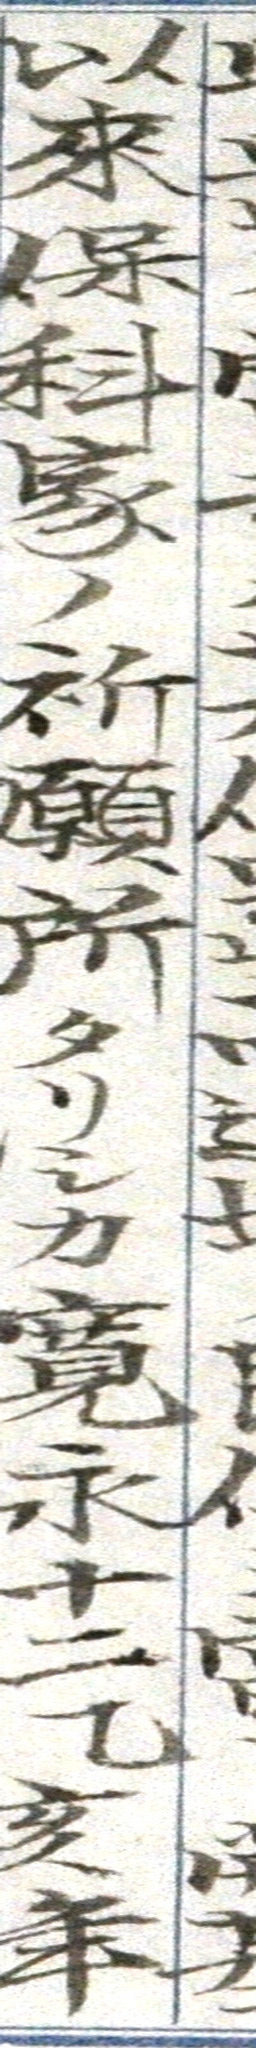以来保科家ノ祈願所タリシカ寛永十二乙亥年
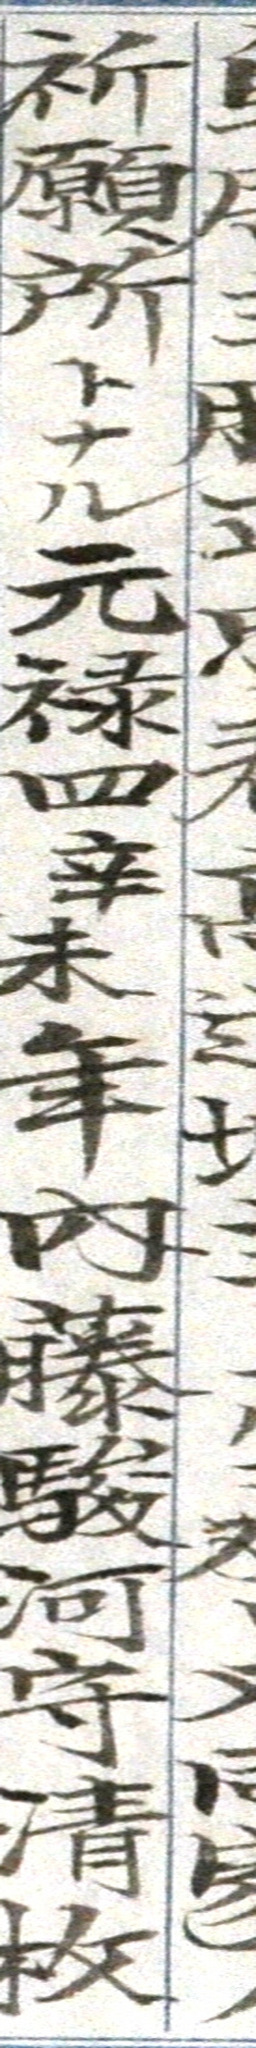祈願所トナル元禄四辛未年内藤駿河守清枚
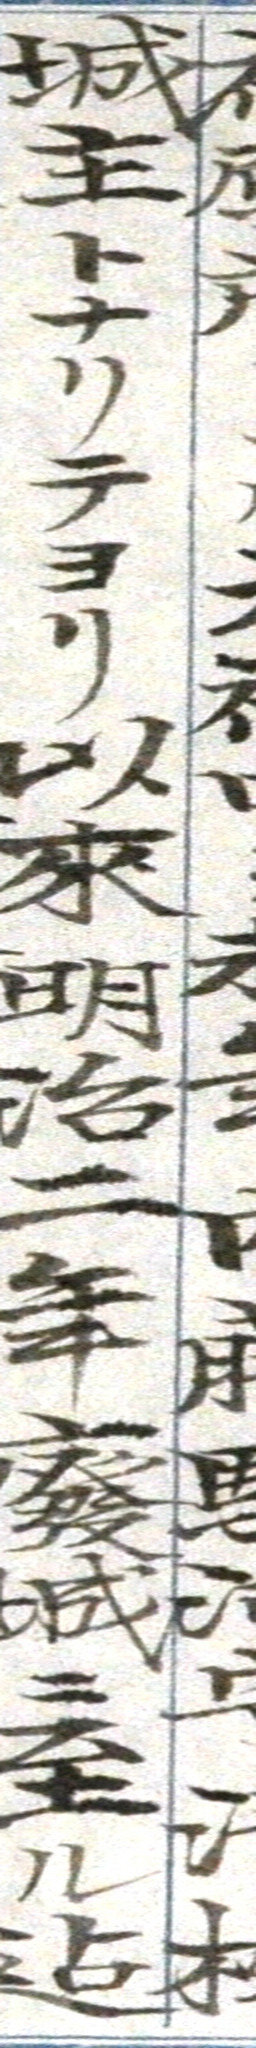城主トナリテヨリ以来明治二年廃城ニ至ル迄
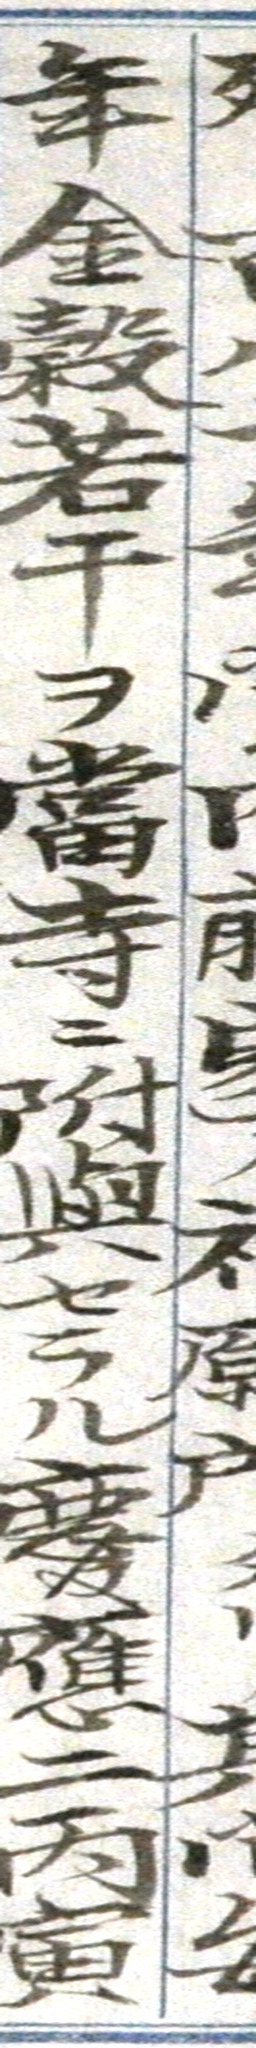年金穀若干ヲ当寺ニ附与セラル慶応二丙寅
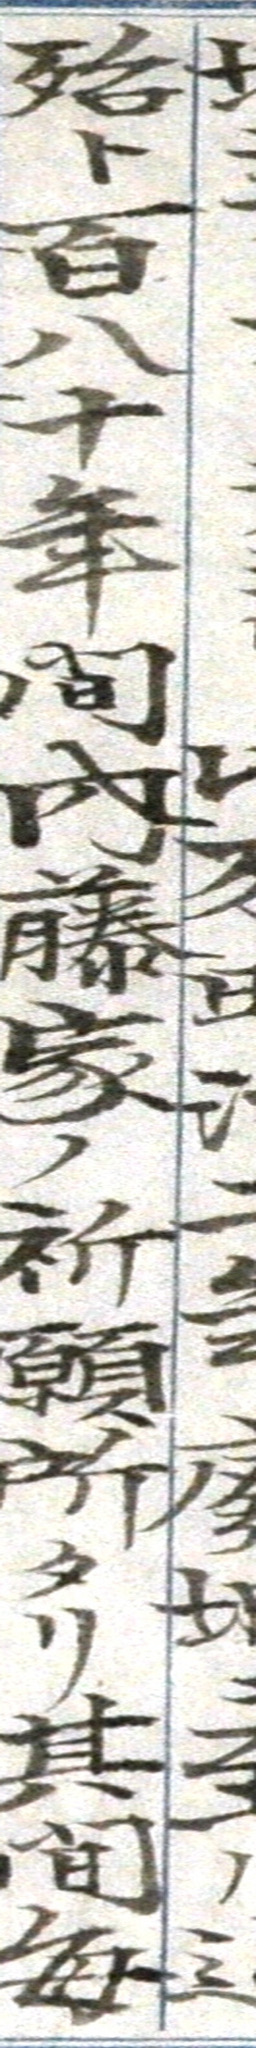殆ト百八十年間内藤家ノ祈願所タリ其間毎
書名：桂泉院・樹林寺・東光寺縁起書、蓮華寺由来書、付夕顔観音記
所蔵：伊那市立高遠町図書館・合同会社AMANE
